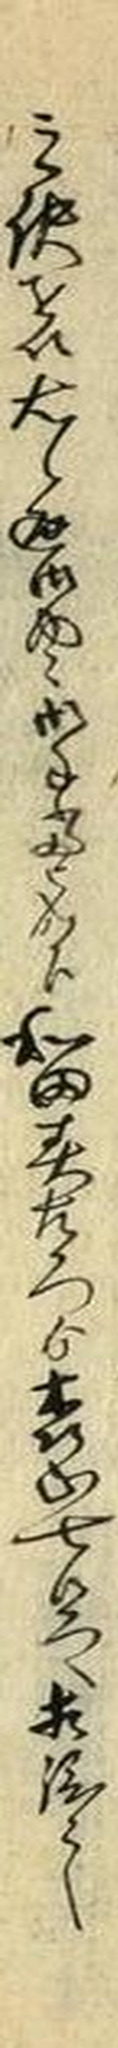之譯を以右之通御内々御手当被成下和田春左衛門ゟ森山七右衛門へ相渡之
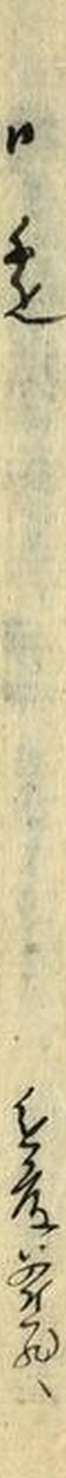金千疋近藤斧蔵へ
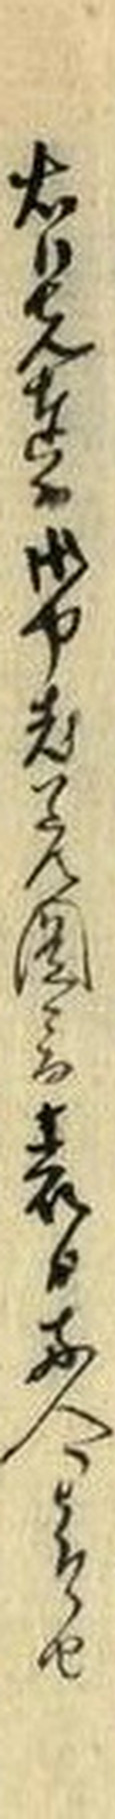右ハ先達而御中老指図ニ而表ゟ両人へ被下候由
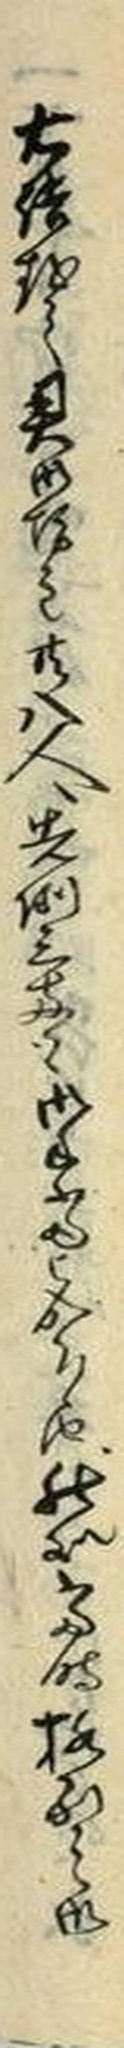右詰越之奥御坊主共八人へ先例三両ツゝ御手当被成下候由然処当時格別之御
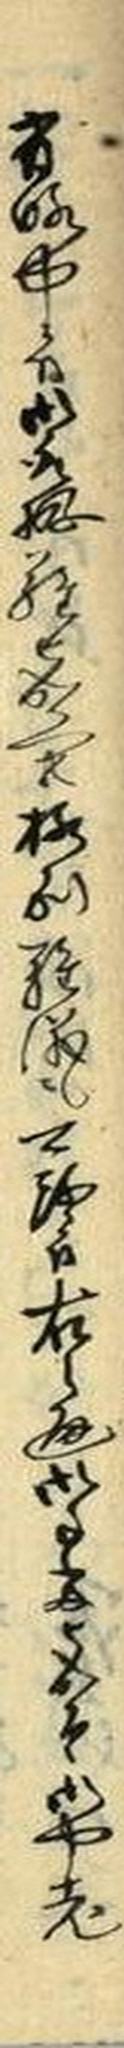省略中ニ付御取扱難被成候へ共格別難儀も可致候付右之通御手当被成下候御中老
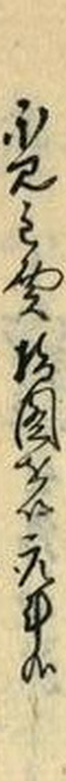永見主殿指図を以取斗候
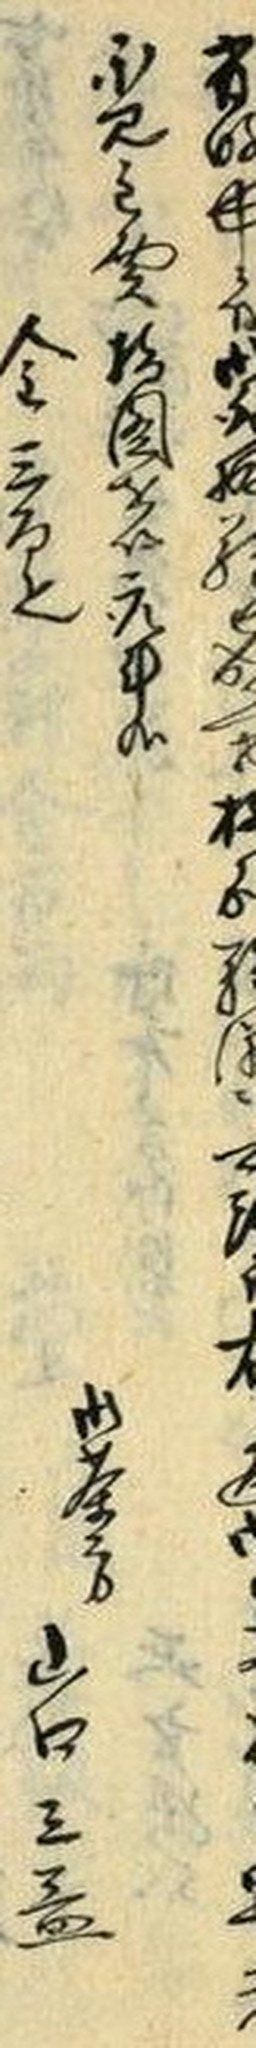金三百疋御茶方山口三益
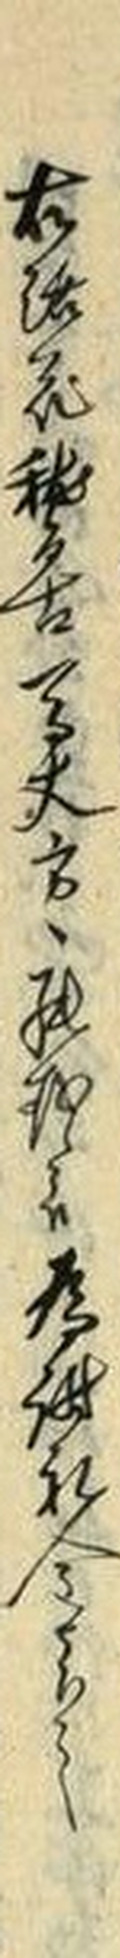右活花稽古馬丈方へ罷越候ニ付為謝礼金被下之
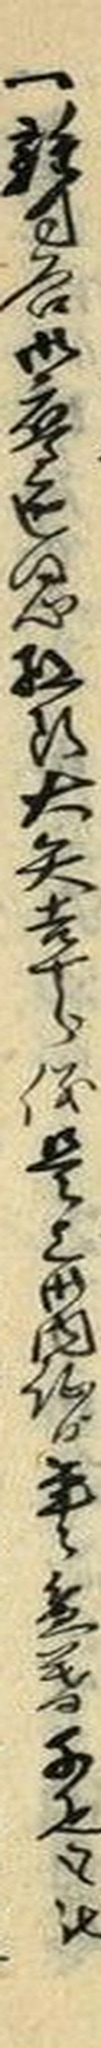一雑司谷御鷹匠同心組頭大矢吉十郎儀是迄御内証ゟ年々盆暮百疋ツゝ被
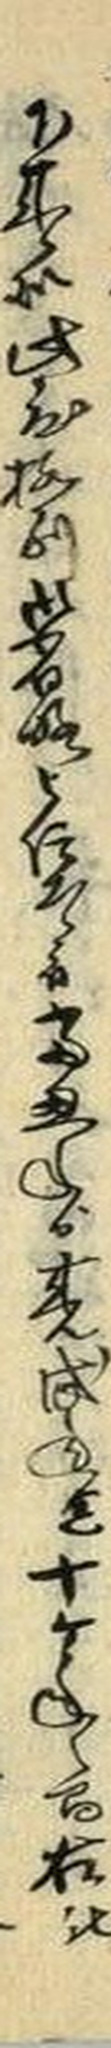下来候処此度格別御省略被仰出候ニ付当丑年ゟ来ル戌年迄十ヶ年之間右被
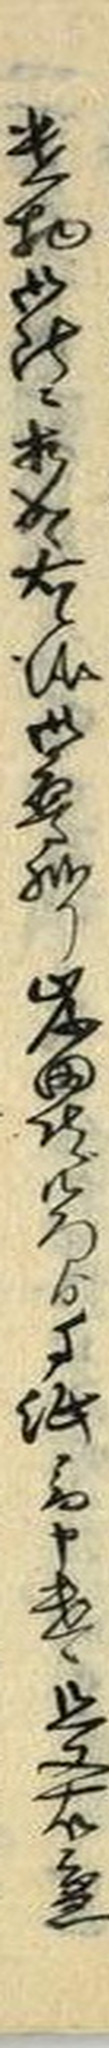遣物御断ニ相成候右之趣御鷹掛り岸田次郎左衛門ゟ手紙ニ而申遣候且又右盆
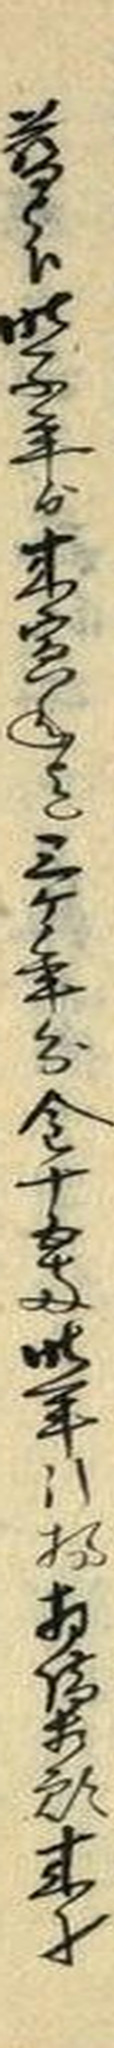暮被下昨子年ゟ来寅年迄三ヶ年分金十五両昨年引揚拝借相願来子
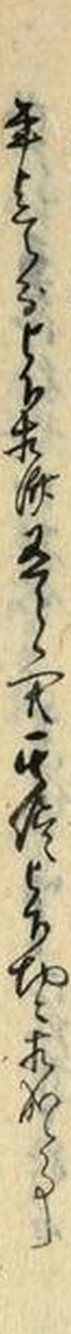年迄之分被下相済有之候へ共其侭被下切に相成候事
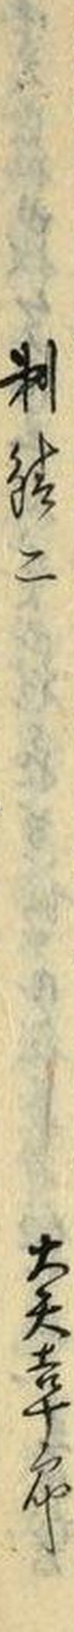刺鯖二大矢吉十郎
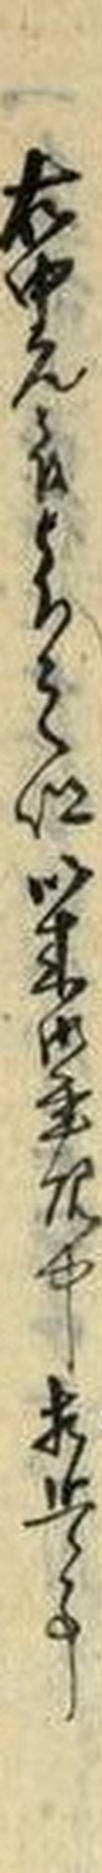右中元ニ付被下之但以来御年限中相止候事
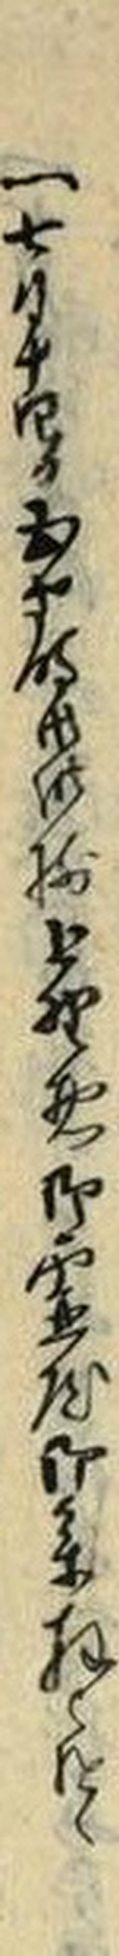一七月十四日五半時御供揃上野惣御霊屋御参拝被遊候
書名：少傅日録抄（斉承付側向頭取日記、在府）
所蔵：福井県文書館 Fukui Prefectural Archives
